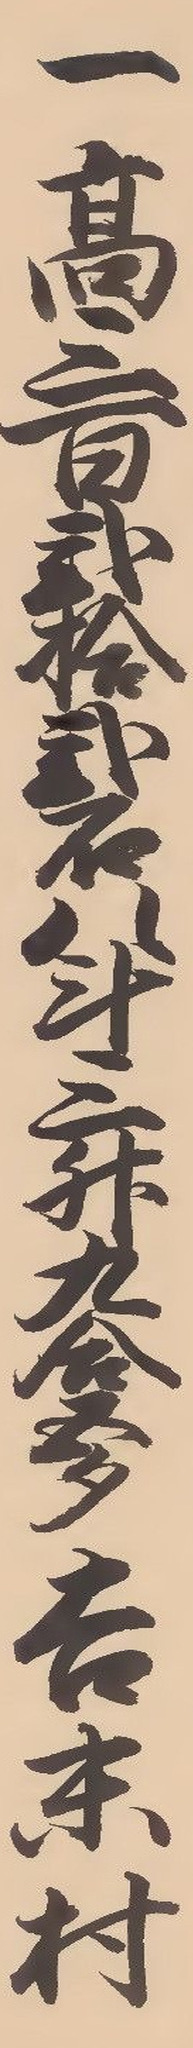一高三百弐拾弐石八斗三升九合五勺吉末村
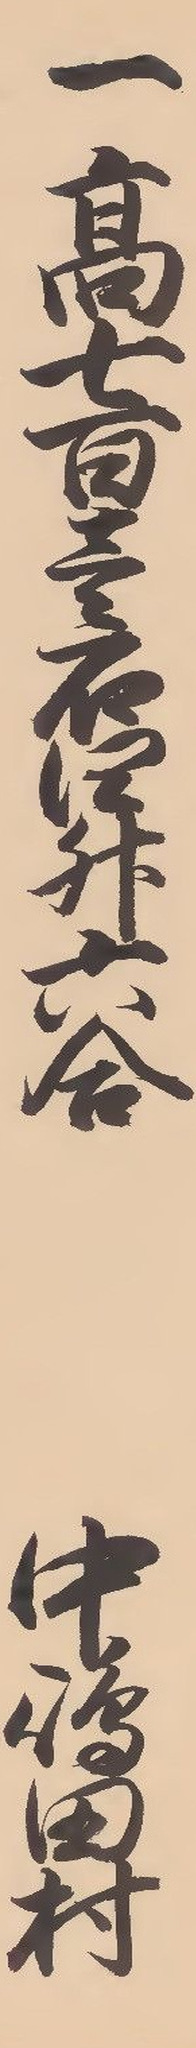一高七百壱石四升六合中島田村
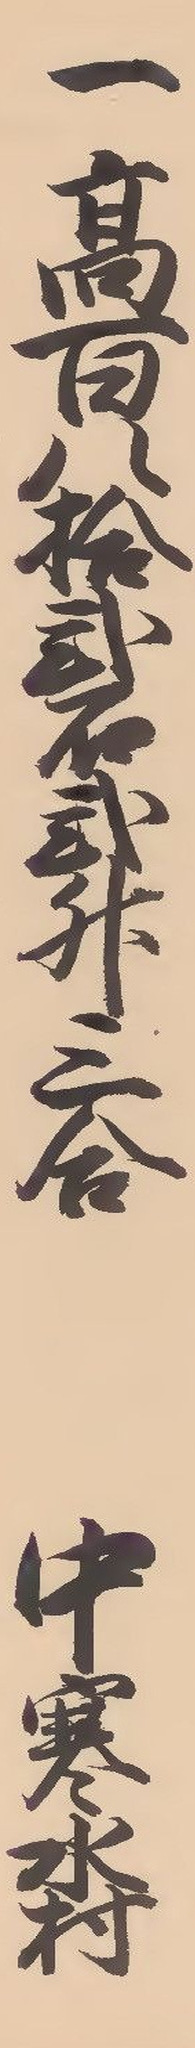一高百八拾弐石弐升三合中寒水村

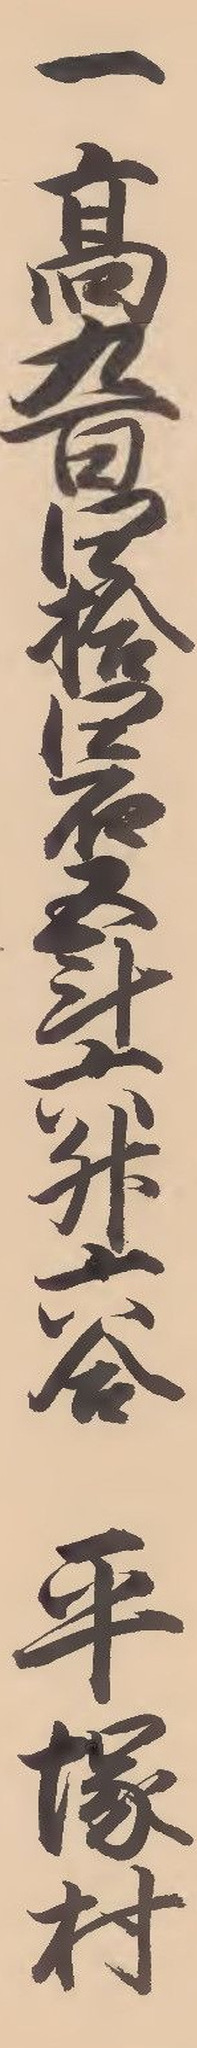一高九百四拾四石五斗六升六合平塚村
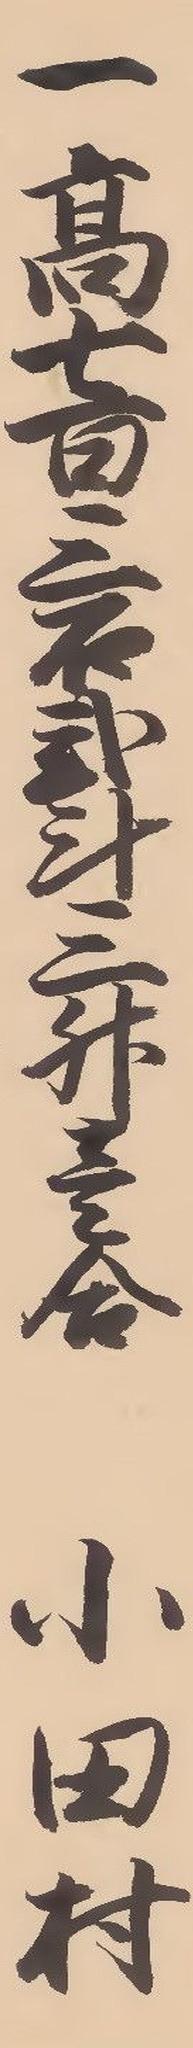一高七百三石弐斗三升壱合小田村
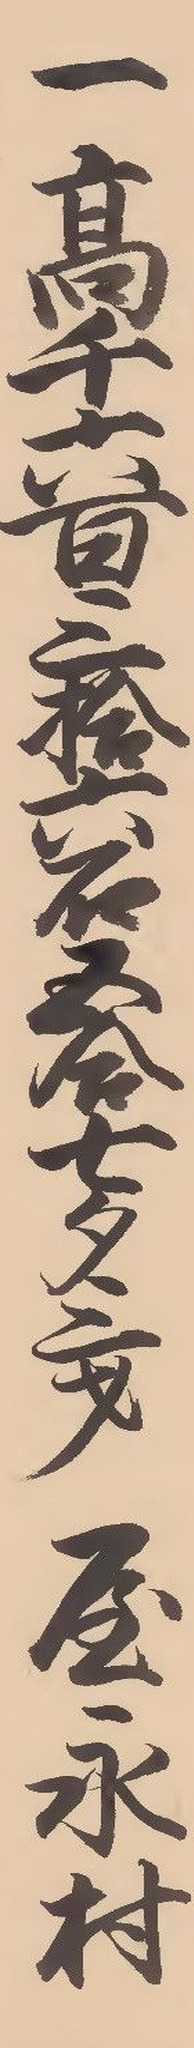一高千六百三拾六石五合七勺三才屋永村
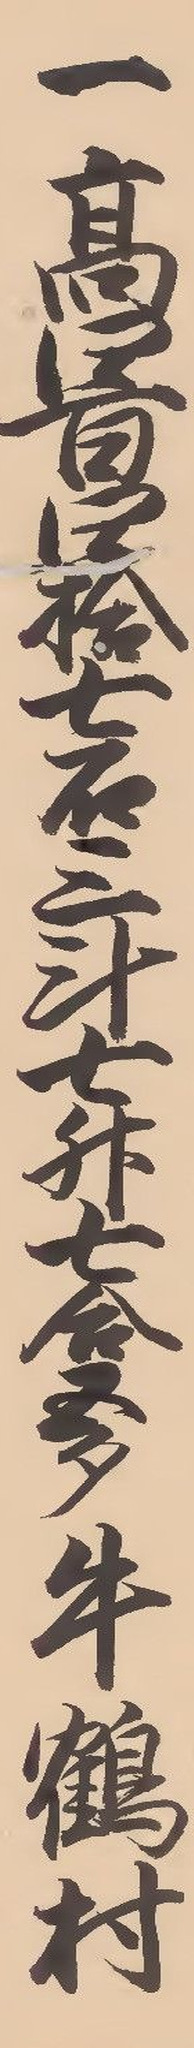一高四百四拾七石三斗七升七合五勺牛鶴村
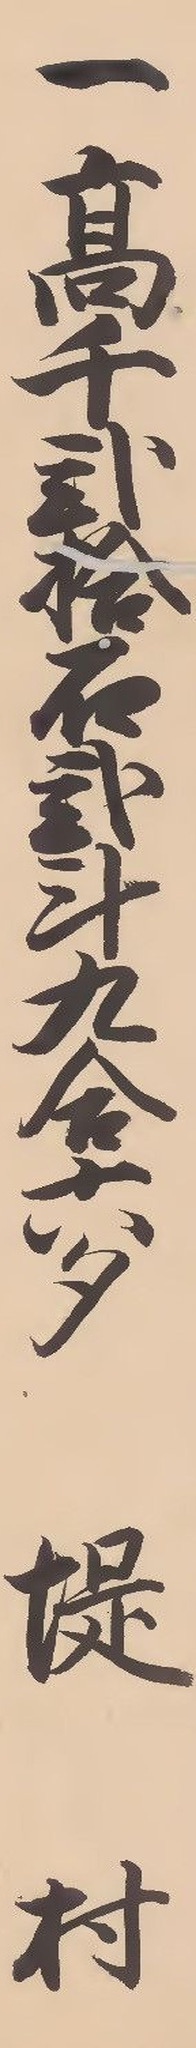一高千弐拾石弐斗九合六勺堤村
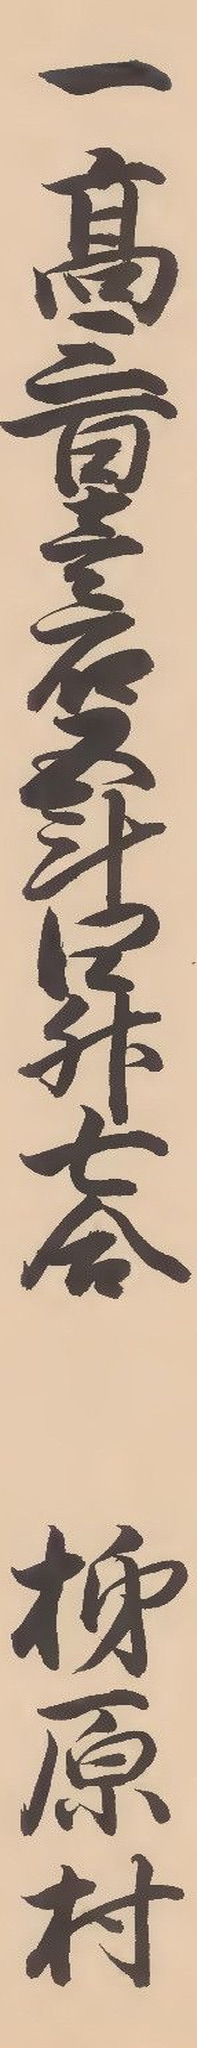一高三百壱石五斗四升七合柿原村
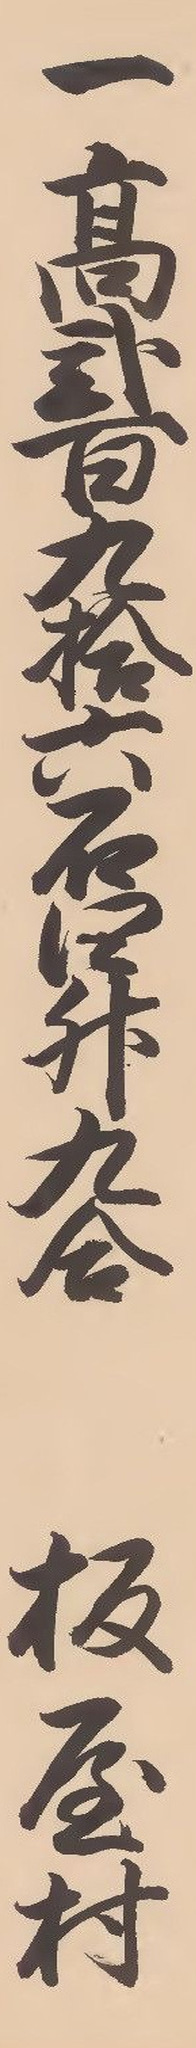一高弐百九拾六石四升九合板屋村
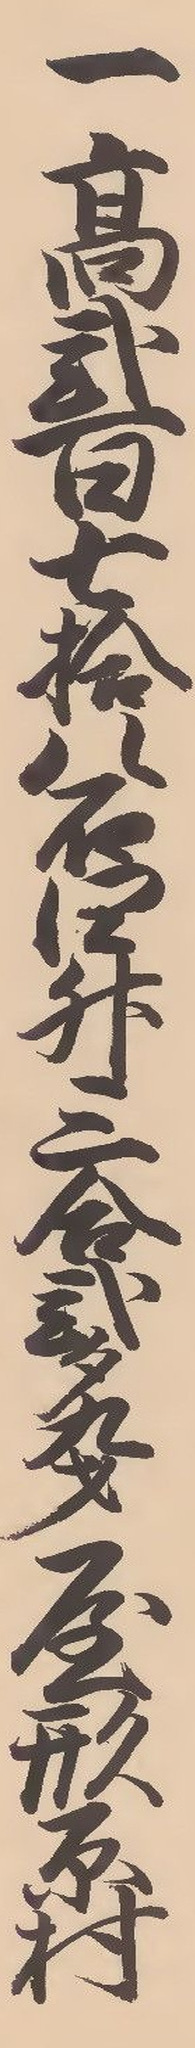一高弐百七拾八石四升三合弐勺九才屋形原村

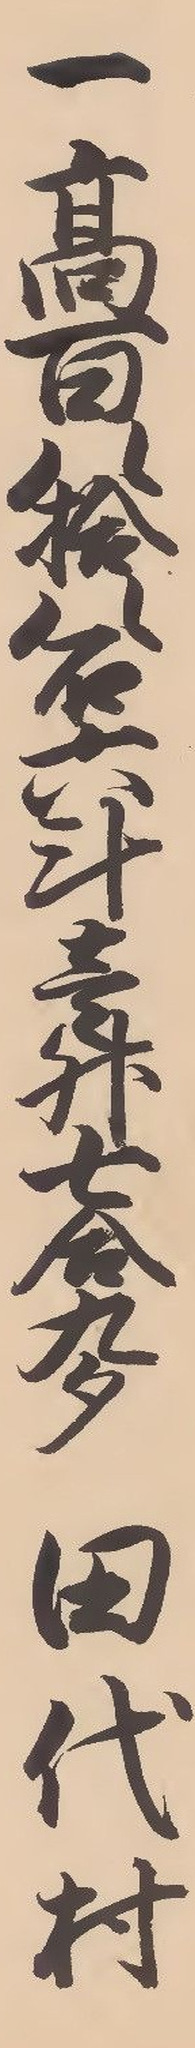一高百八拾八石六斗壱升七合九勺田代村
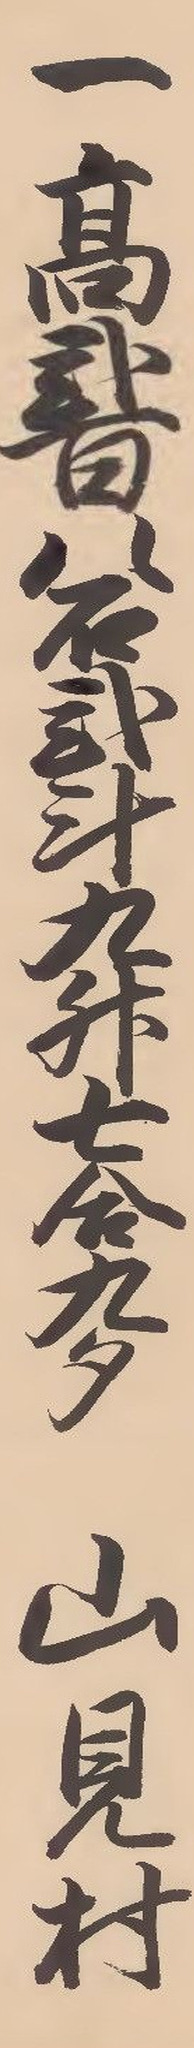一高弐百八石弐斗九升七合九勺山見村
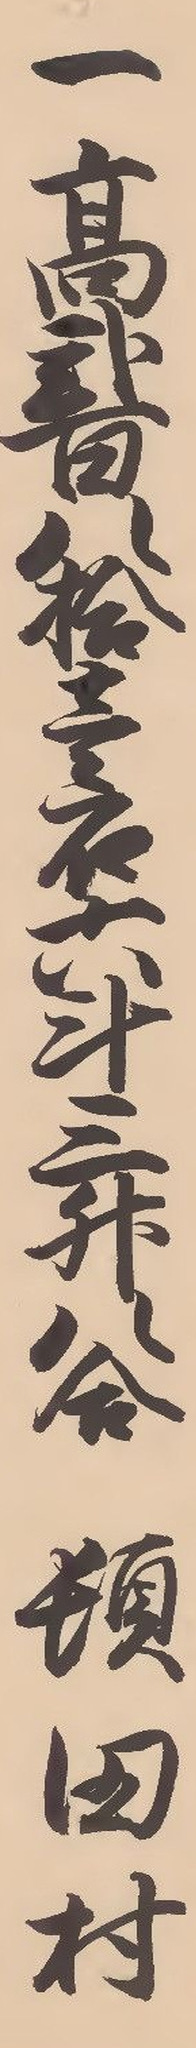一高弐百八拾壱石六斗三升八合頓田村
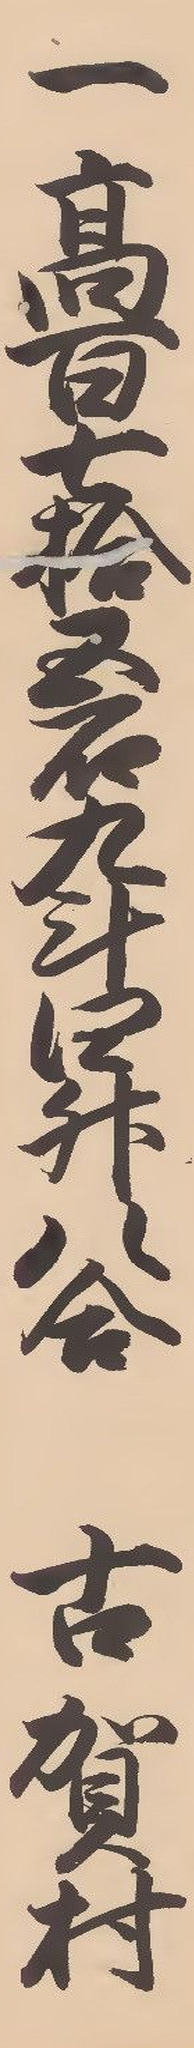一高百七拾五石九斗四升八合古賀村
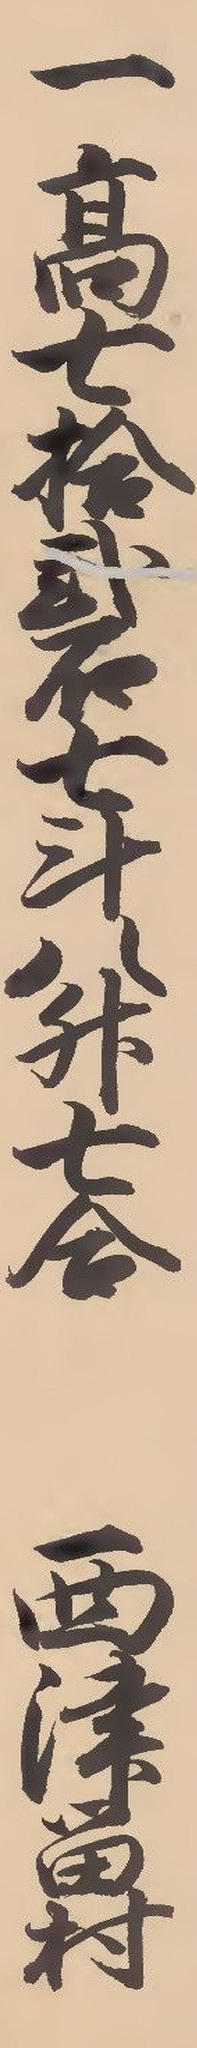一高七拾弐石七斗八升七合西津留村
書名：筑前国郷帳
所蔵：国立公文書館 National Archives of Japan
